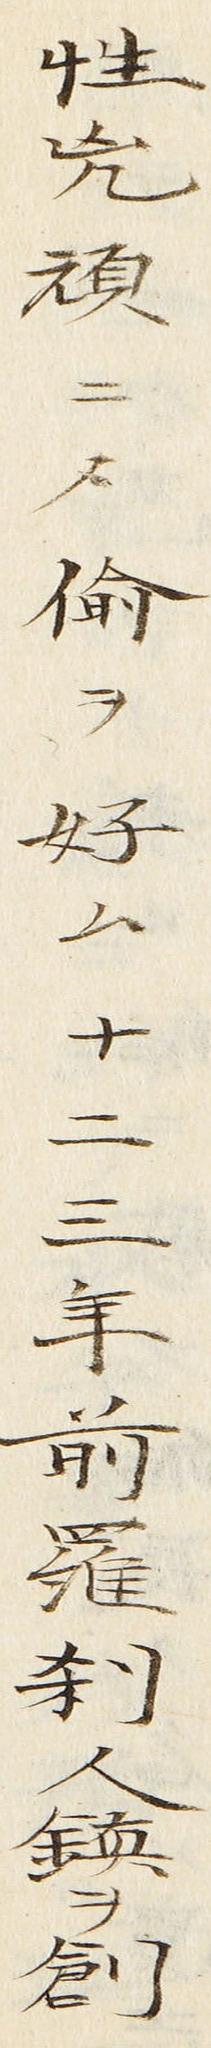性兇頑ニシテ偸ヲ好ム十二三年前羅刹人鎮ヲ創
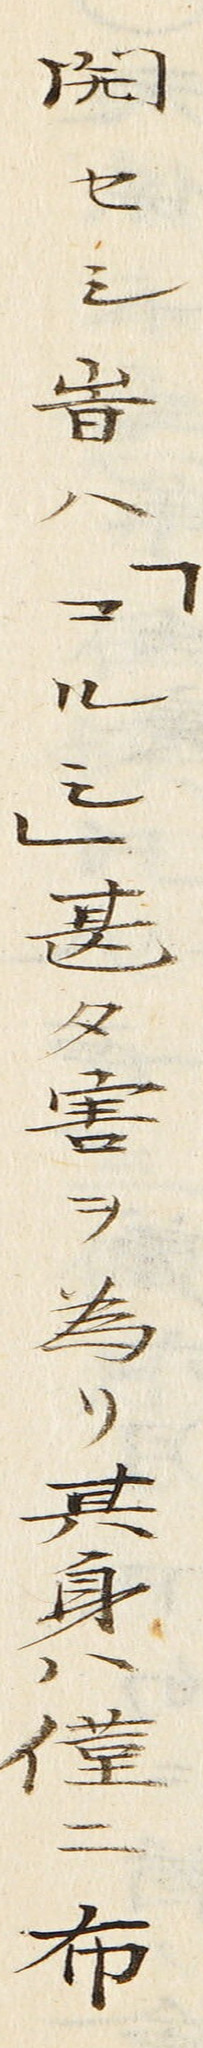開セシ旹ハ「コルシ」甚タ害ヲ為リ其身ハ僅ニ布
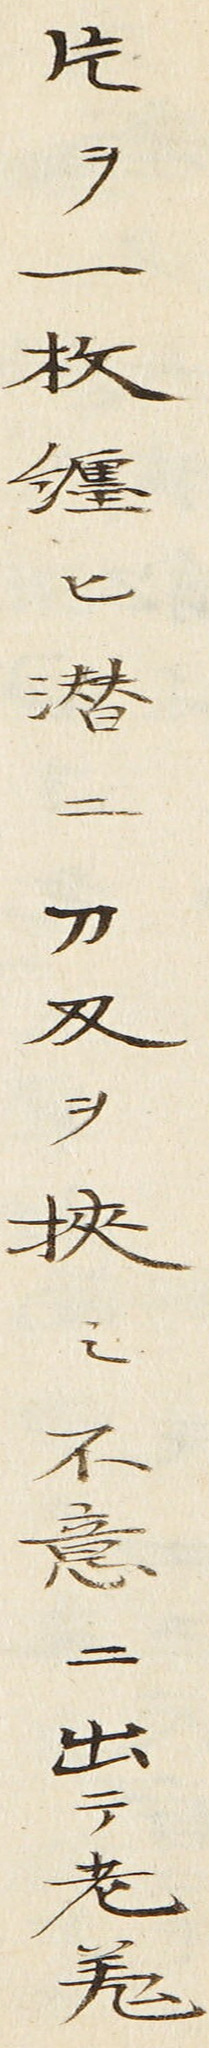片ヲ一枚纒ヒ潜ニ刀刄ヲ挟ミ不意ニ出テ老羗
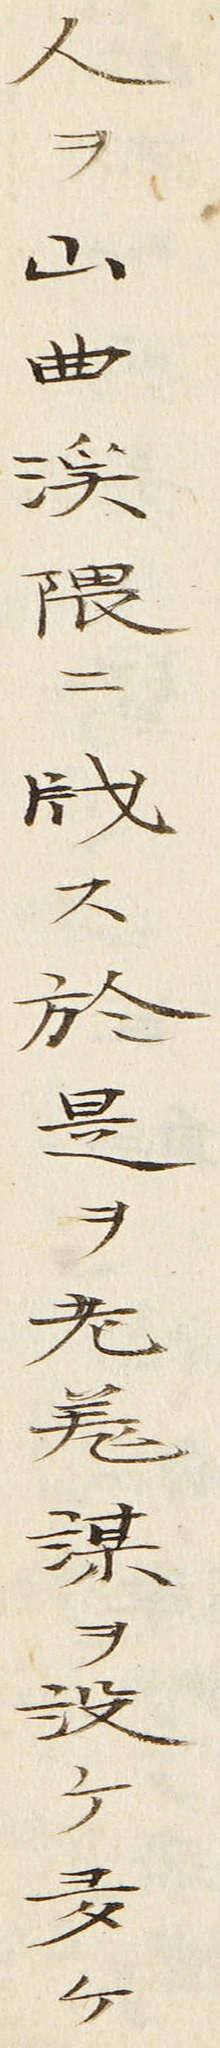人ヲ山曲渓隈ニ戕ス於是ヲ老羗謀ヲ設ケ多ケ
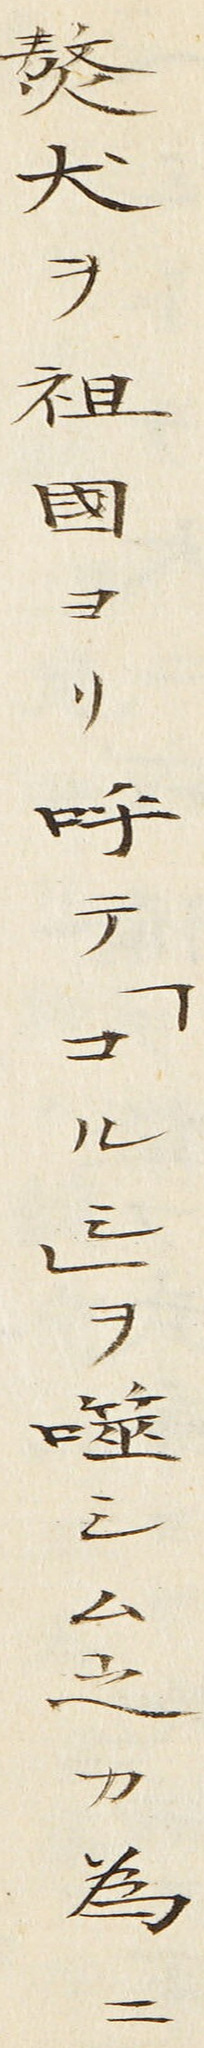𤎅犬ヲ祖国ヨリ呼テ「コルシ」ヲ噬シム之カ為ニ
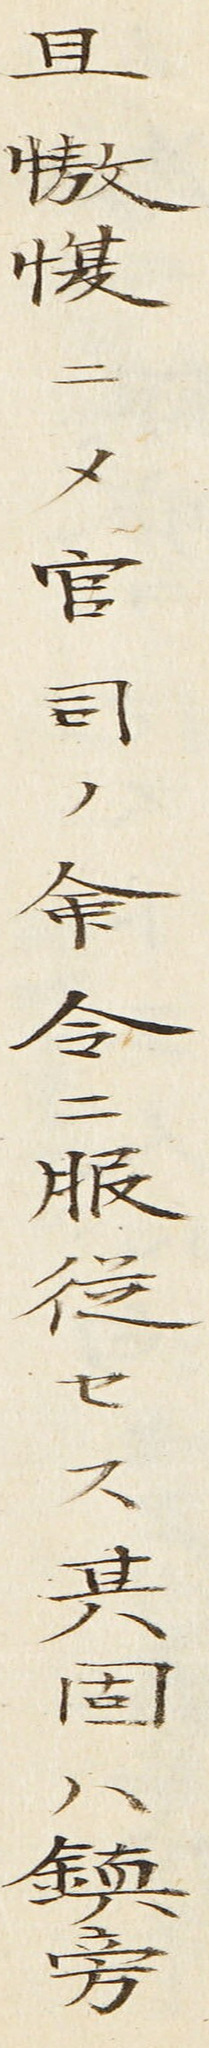且慠愎ニシテ官司ノ命令ニ服従セス其固ハ鎮旁
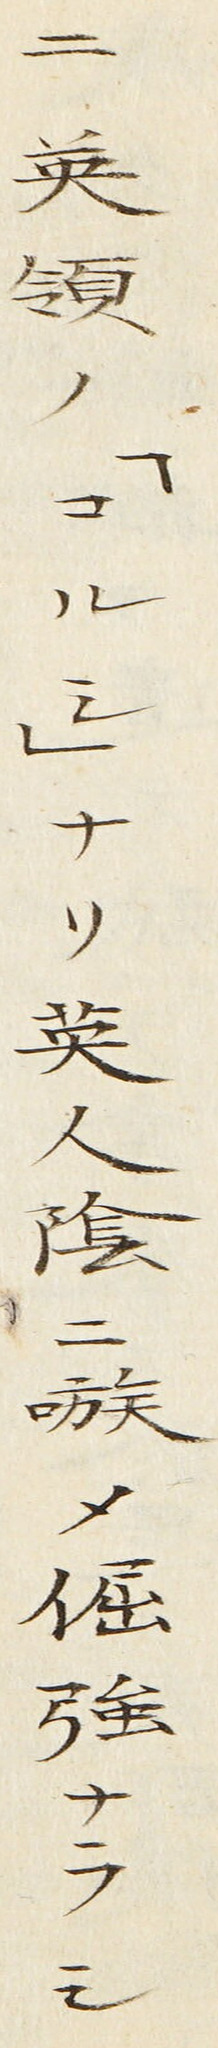ニ英領ノ「コルシ」ナリ英人陰ニ嗾シテ倔強ナラシ
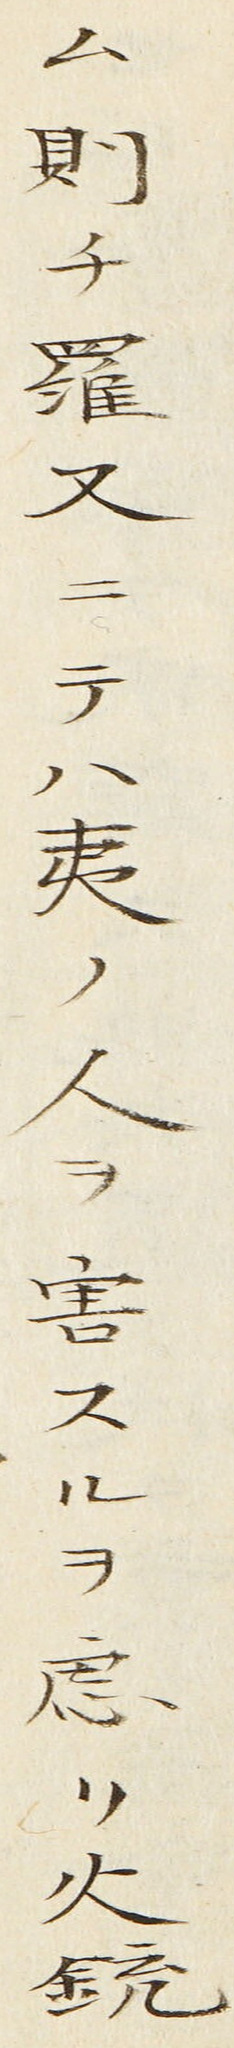ム則チ羅又ニテハ夷ノ人ヲ害スルヲ慮リ火銃
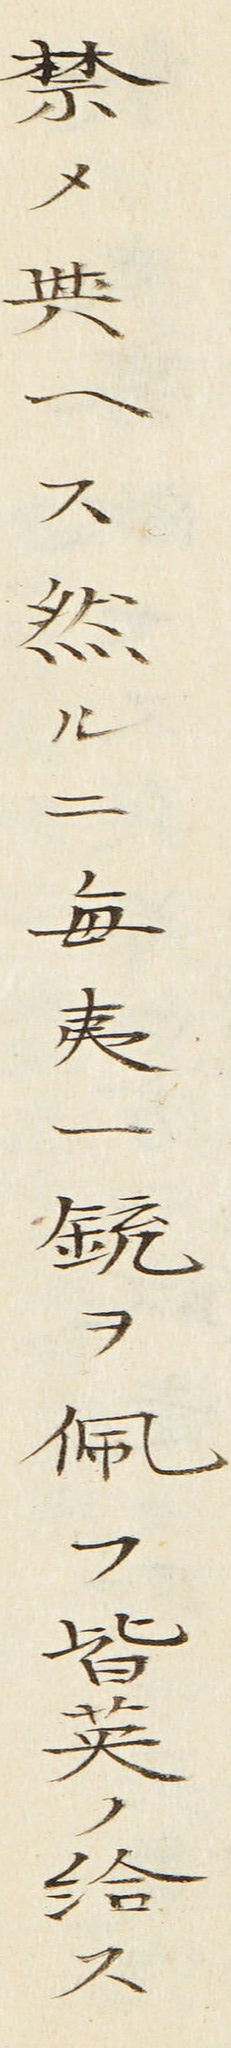禁シテ与ヘス然ルニ毎夷一銃ヲ佩フ皆英ノ給ス
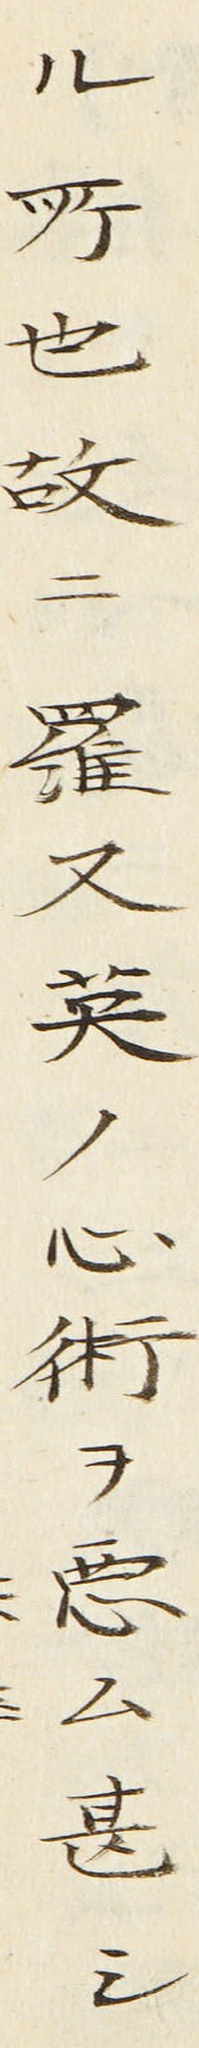ル所也故ニ羅又英ノ心術ヲ悪ム甚シ
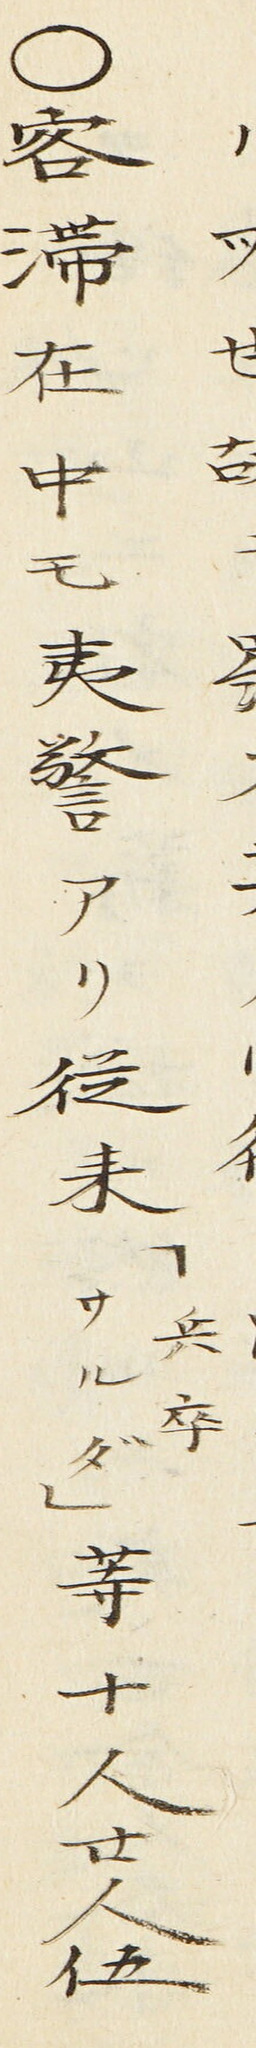○客滞在中モ夷警アリ従来サルダ等十人廿人伍

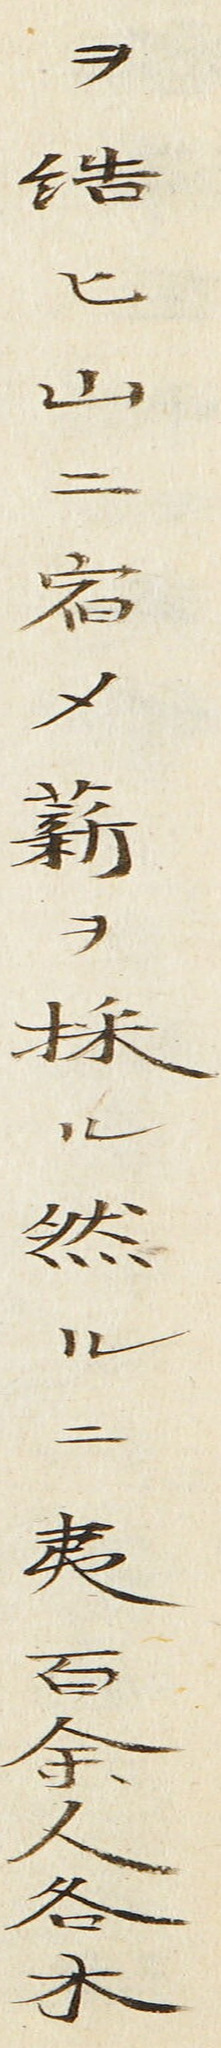ヲ結ヒ山ニ宿シテ薪ヲ採ル然ルニ夷百余人各木
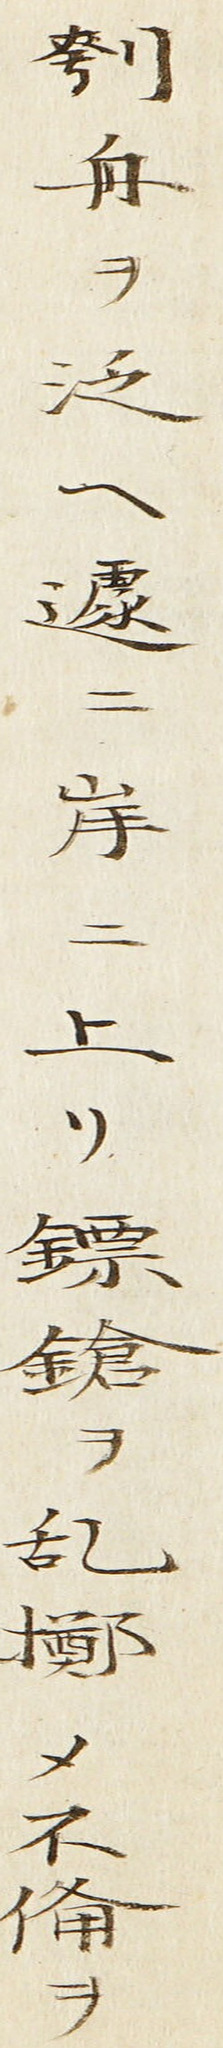刳舟ヲ泛ヘ遽ニ岸ニ上リ鏢鎗ヲ乱擲シテ不備ヲ
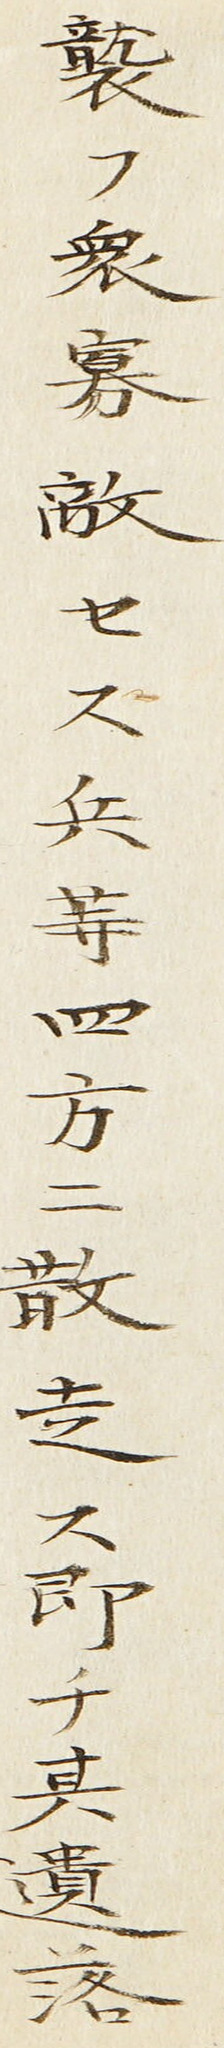襲フ衆寡敵セス兵等四方ニ散走ス即チ其遺落
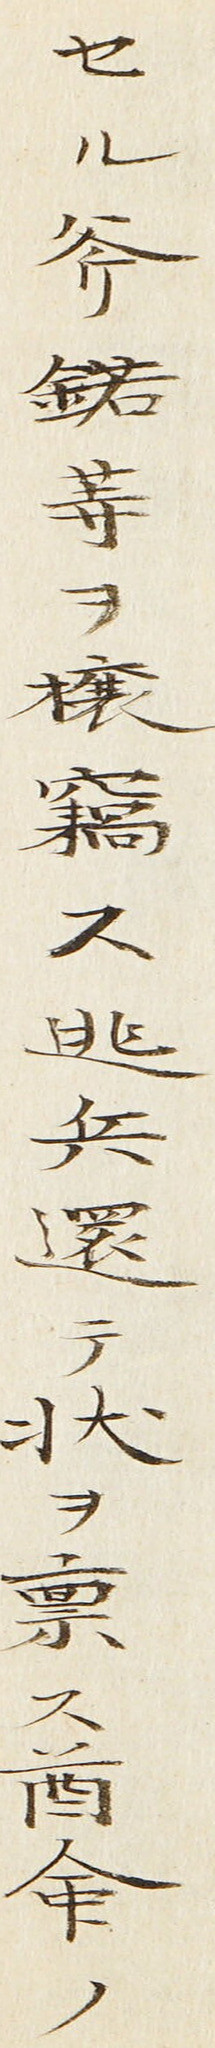セル斧鍩等ヲ攘竊ス逃兵還テ状ヲ禀ス酋命ノ
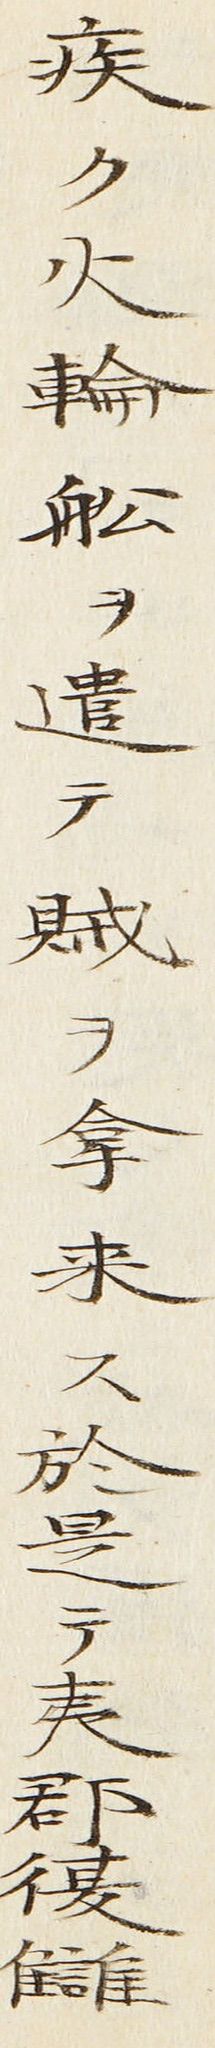疾ク火輪船ヲ遣テ賊ヲ拿来ス於是テ夷郡復讎
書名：流蕃通書
